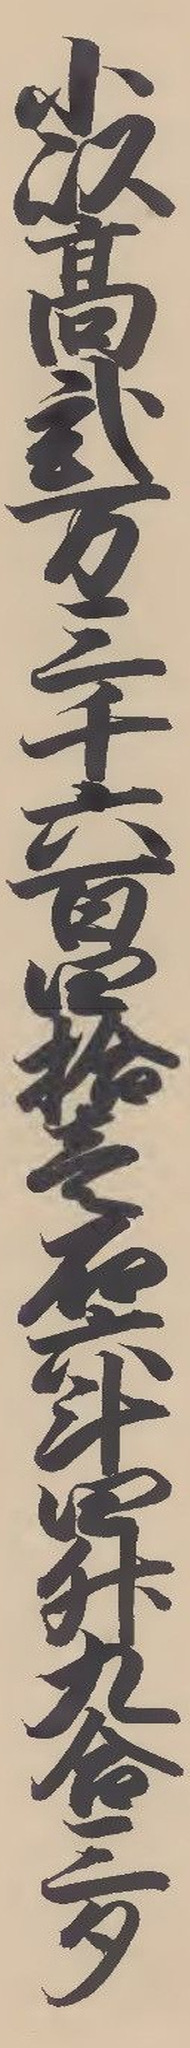小以高弐万三千六百四拾壱石六斗四升九合三勺

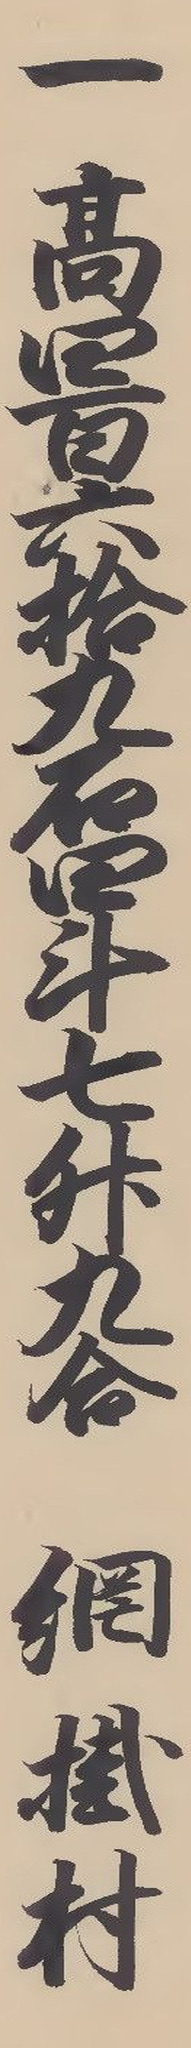一高四百六拾九石四斗七升九合網掛村
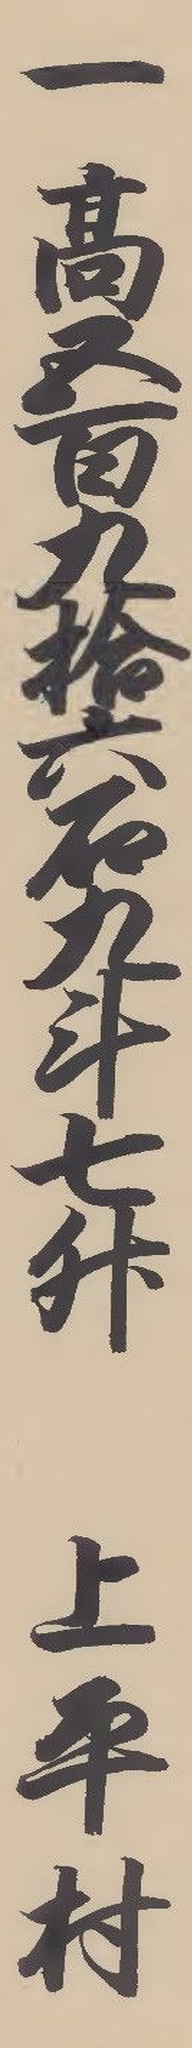一高五百九拾六石九斗七升上平村
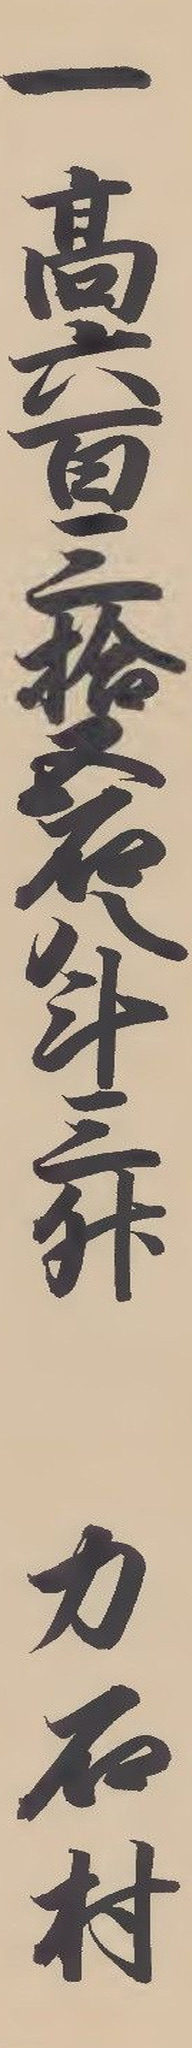一高六百三拾五石八斗三升力石村
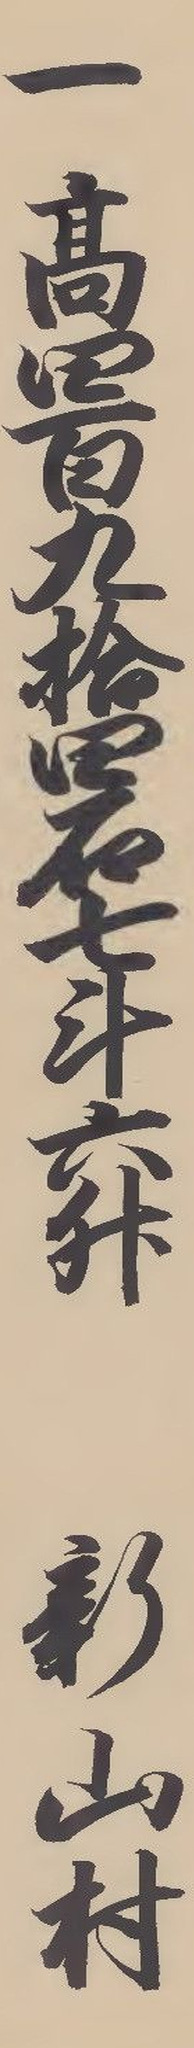一高四百九拾四石七斗六升新山村
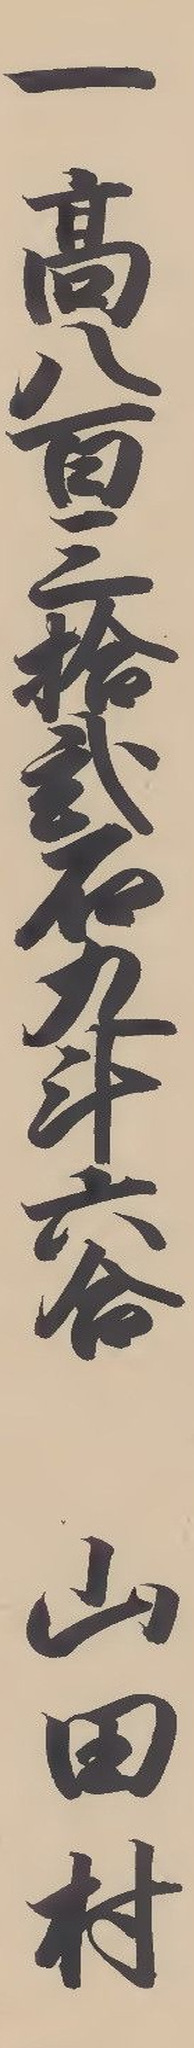一高八百三拾弐石九斗六合山田村
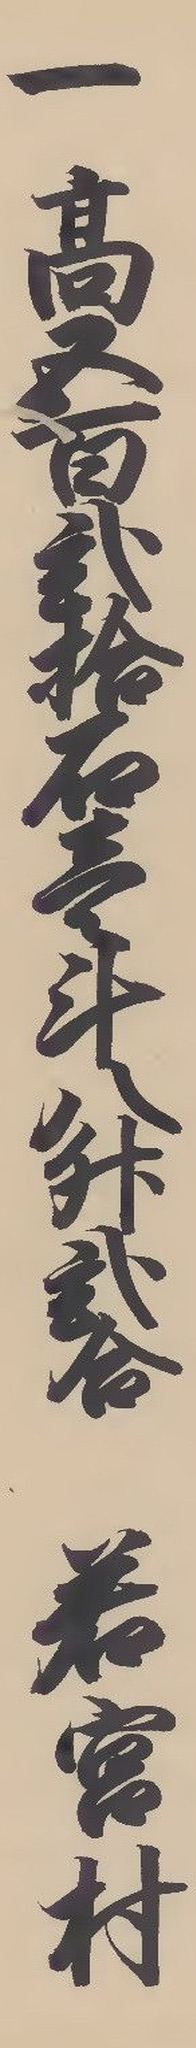一高五百弐拾石壱斗八升弐合若宮村

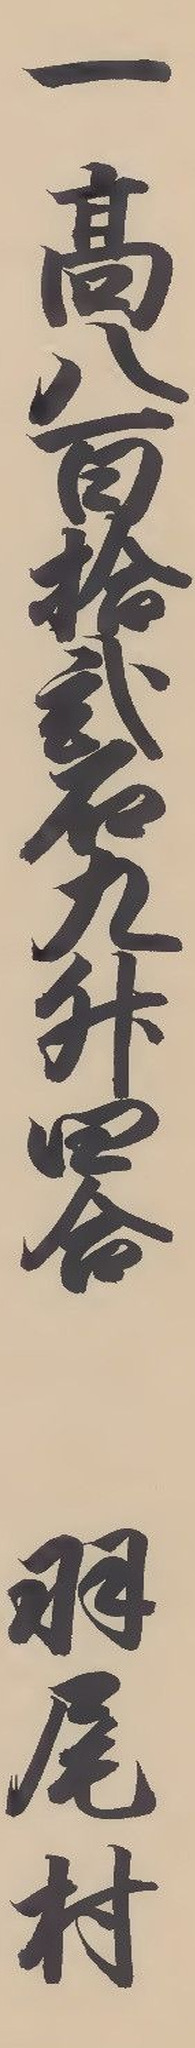一高八百拾弐石九升四合羽尾村
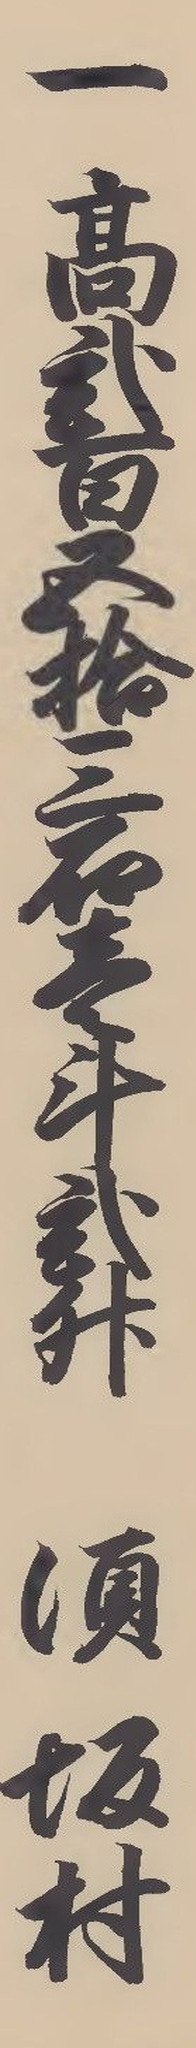一高弐百五拾三石壱斗弐升須坂村
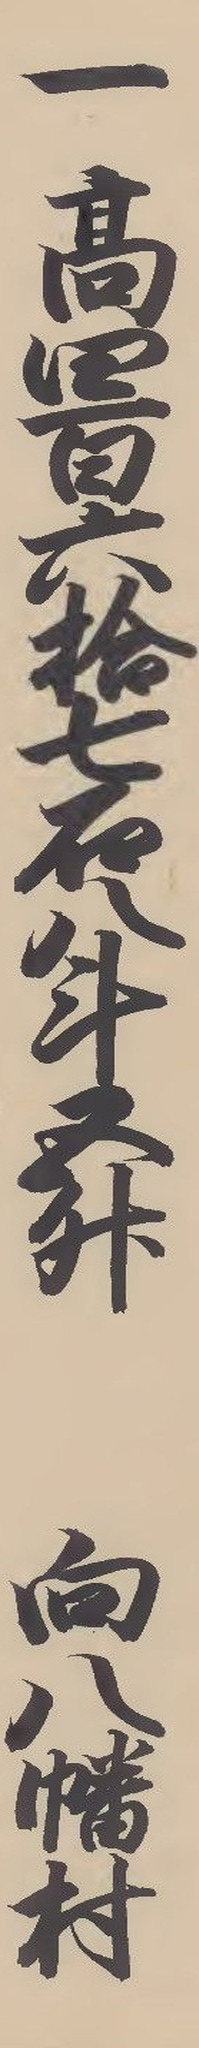一高四百六拾七石八斗五升向八幡村
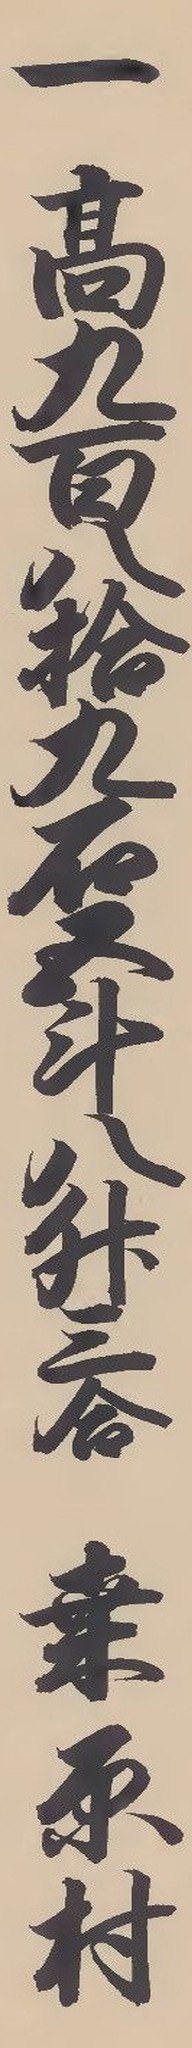一高九百八拾九石五斗八升三合桑原村
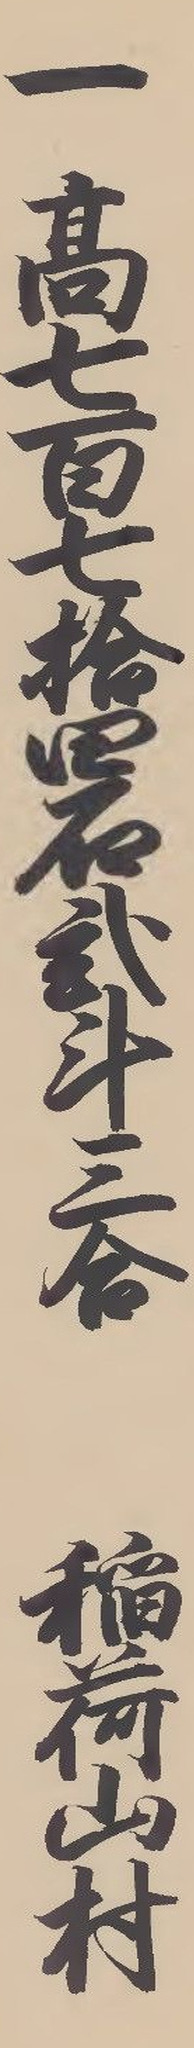一高七百七拾四石弐斗三合稲荷山村
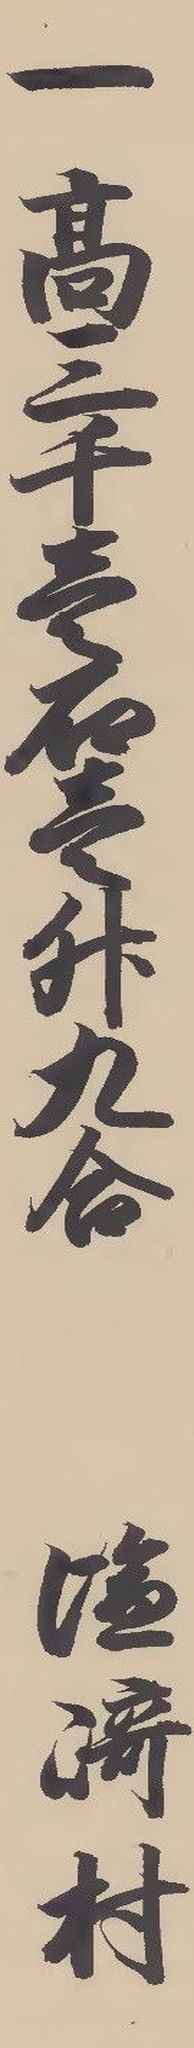一高三千壱石壱升九合塩崎村
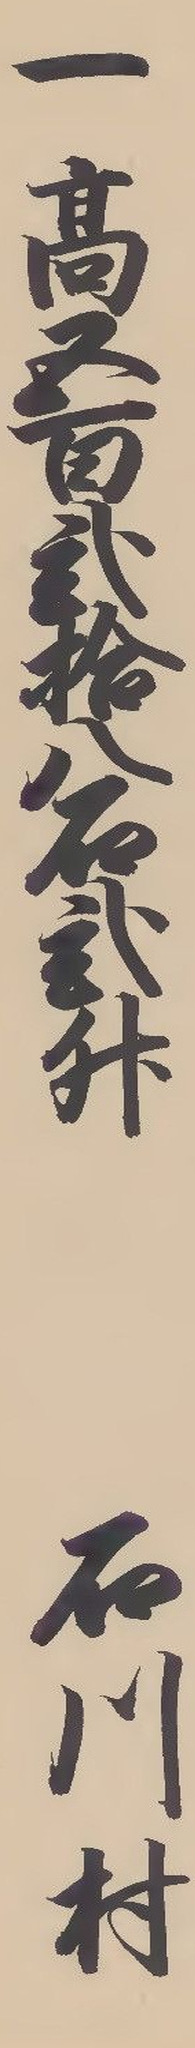一高五百弐拾八石弐升石川村

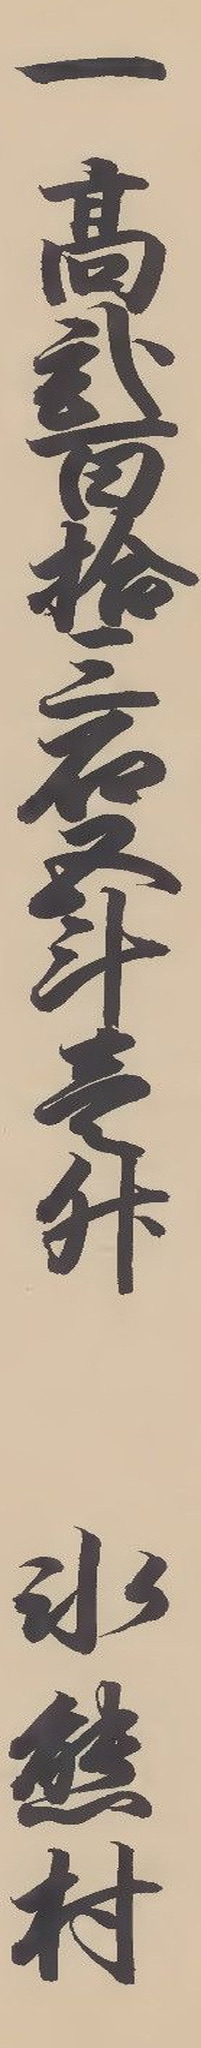一高弐百拾三石五斗壱升氷熊村
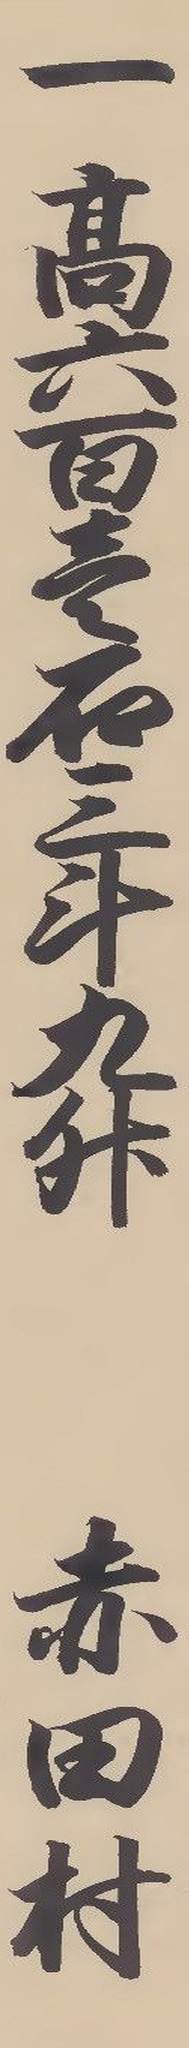一高六百壱石三斗九升赤田村
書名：信濃国郷帳
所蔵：国立公文書館 National Archives of Japan
